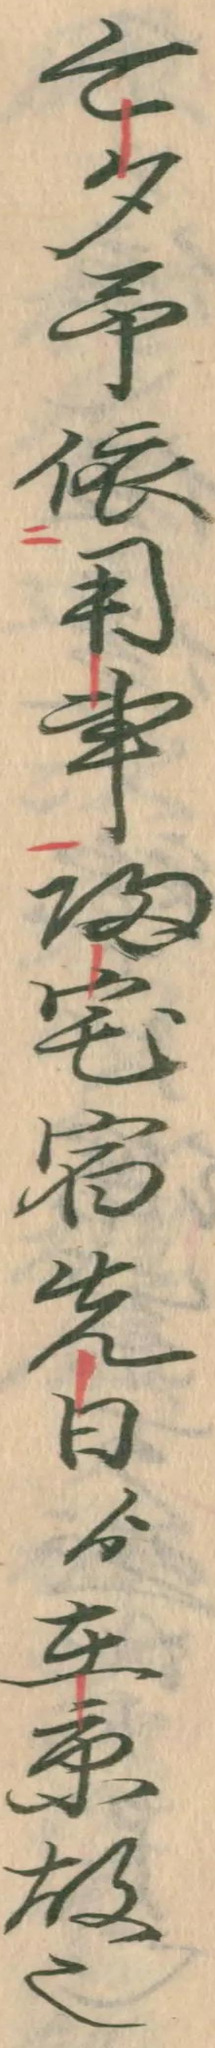今-夕予依用-事帰-宅宿先-日ゟ在-京故也
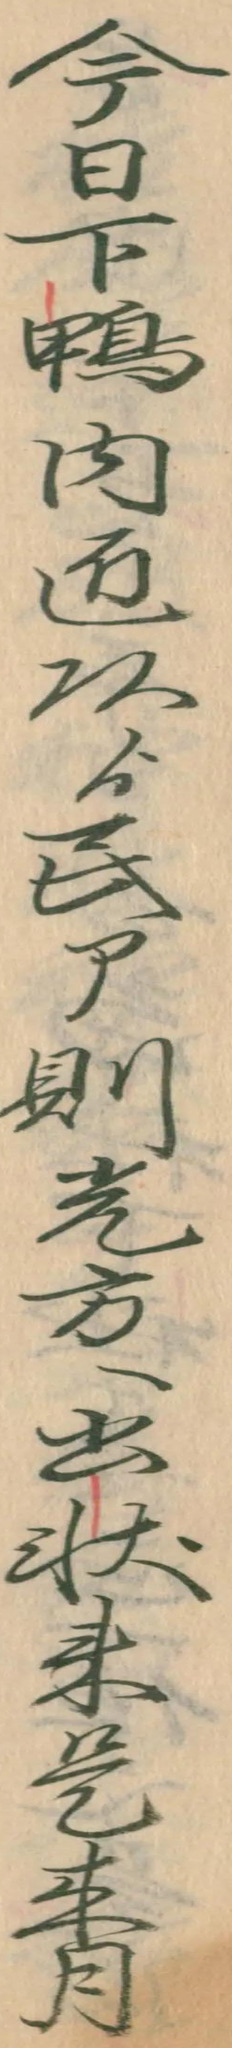今日下_鴨内匠頭ゟ民部則光方へ書-状来是来月
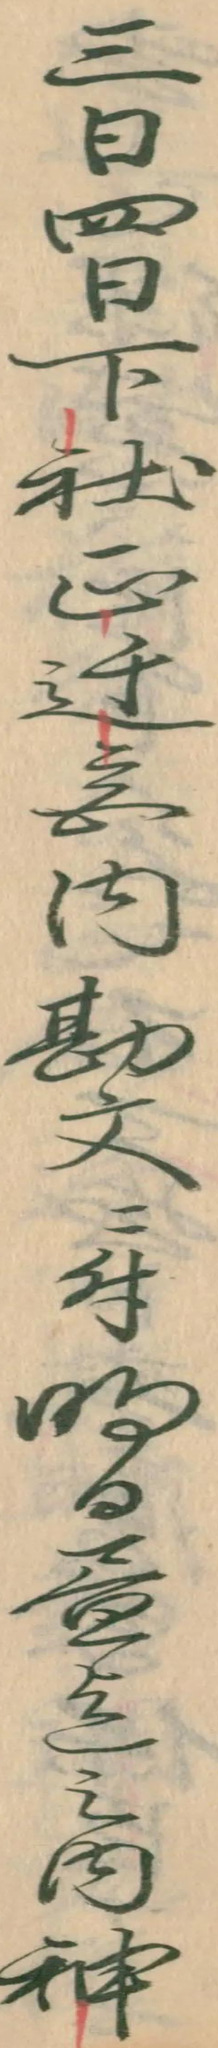三日四日下_社正-迁-宮内勘文ニ付明日昼迄之内神-
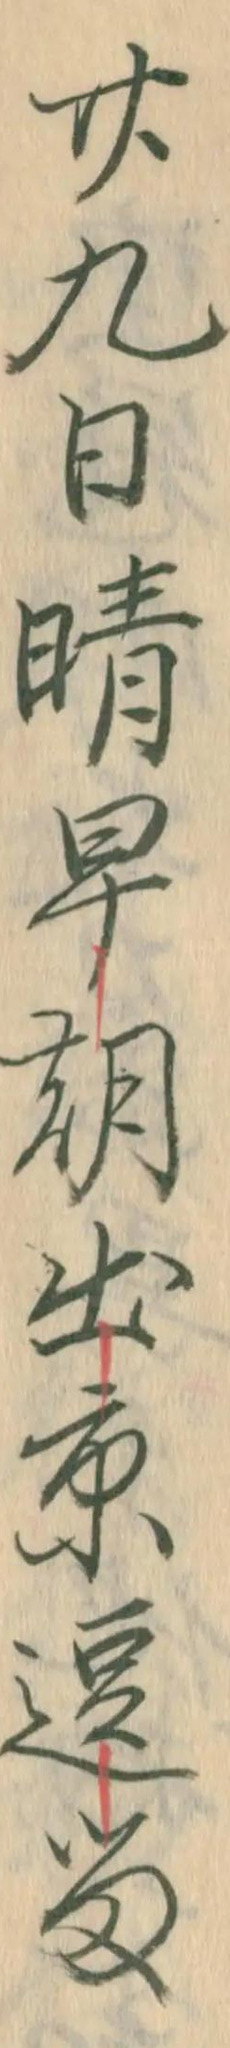廿九日晴早-朝出-京逗-留

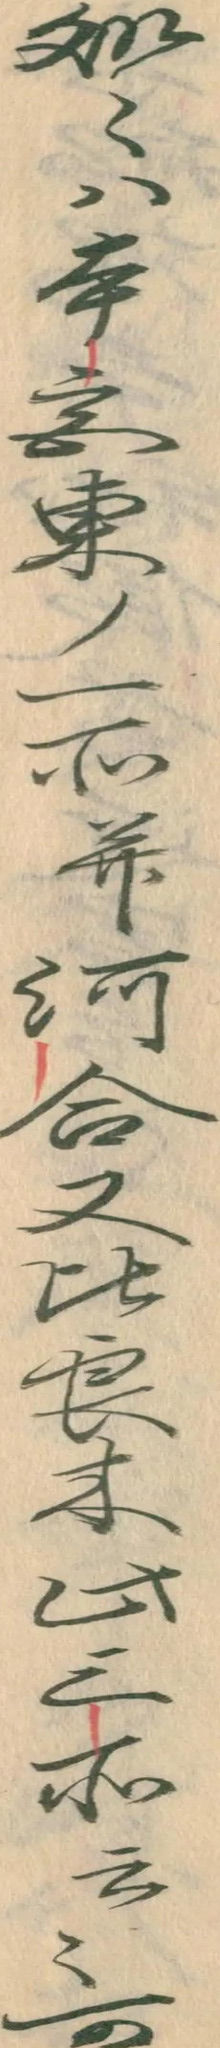処々ハ本-宮東ノ一所并河_合又比良木此三-所云々可
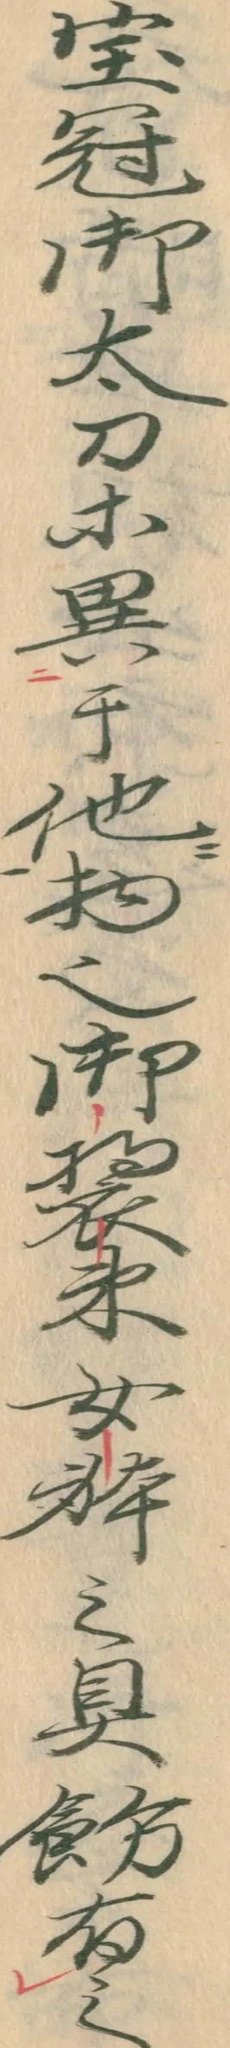宝冠御太刀等異于他ニ物也御-装-束女-体之具錺有之
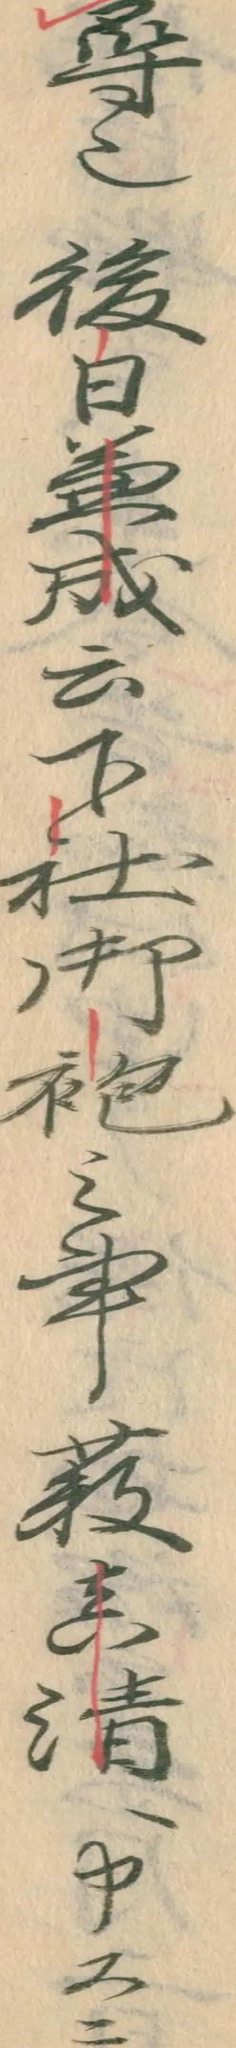尋也後-日兼成云下_社御-袍之事薮真清へ申候ニ
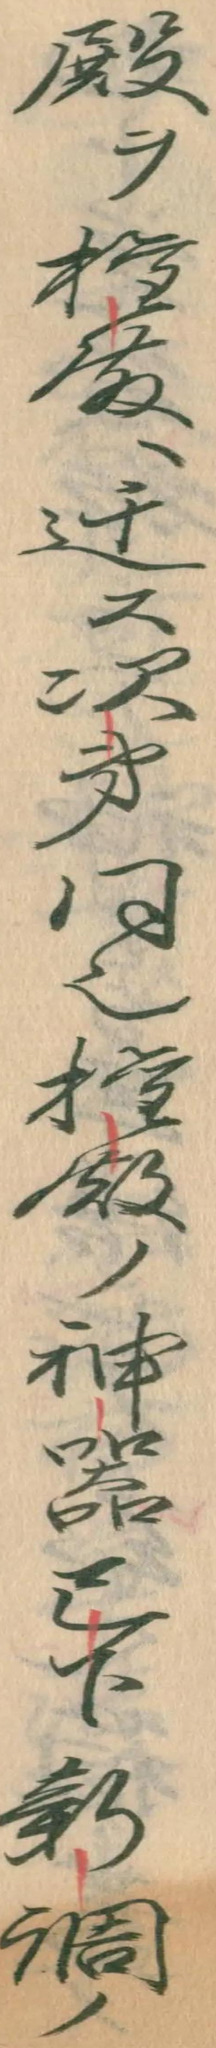殿ヲ権-殿ヘ迁ス次-第同也権-殿ノ神-器已-下新-調ノ
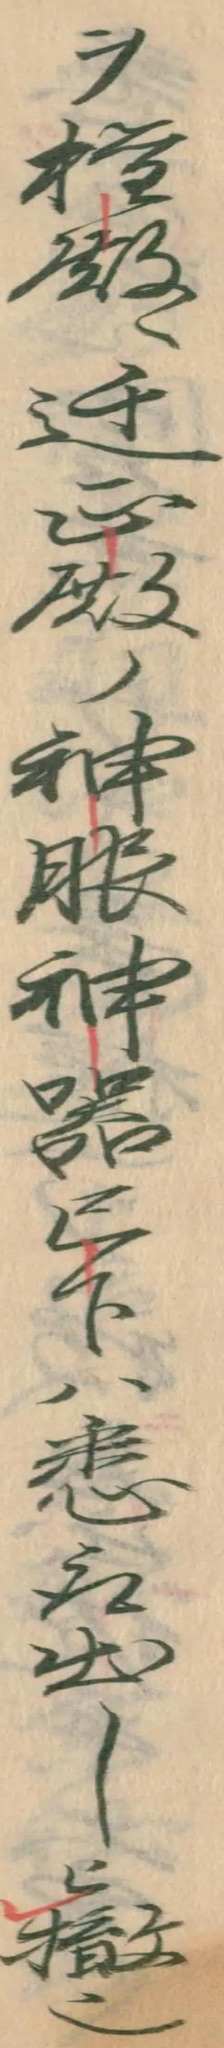ヲ権-殿へ迁正-殿ノ神-服神-器已-下ハ悉取出し被撤也
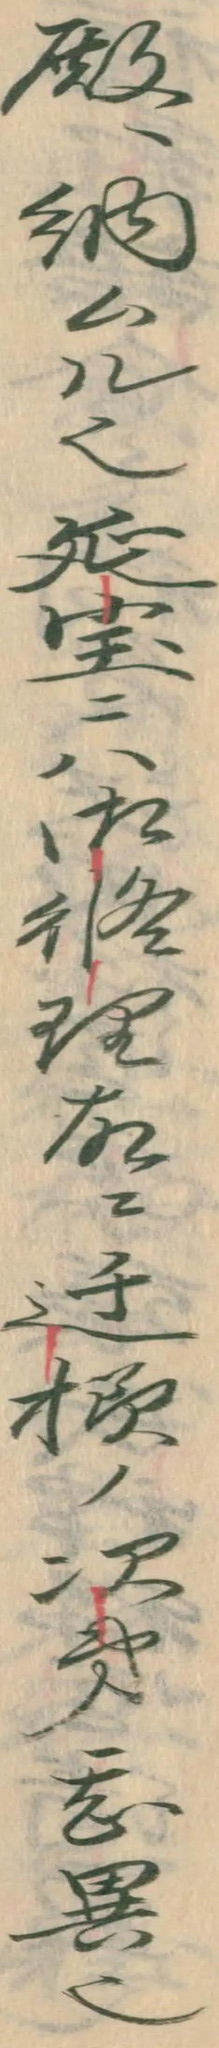殿へ納ムル也延-宝ニハ御-修-理故ニ迁_様ノ次-第甚異也
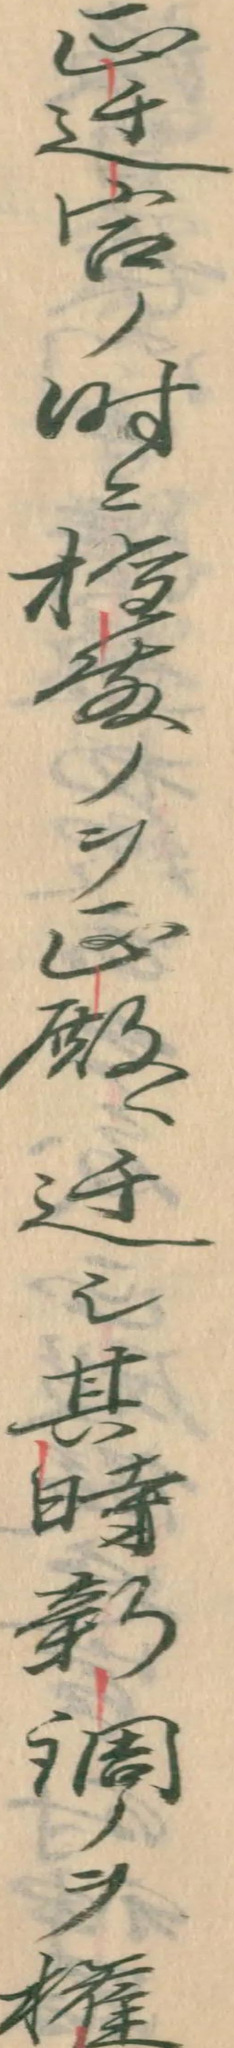正-迁-宮ノ時ニ権-殿ノヲ正-殿へ迁シ其_時新-調ノヲ権-
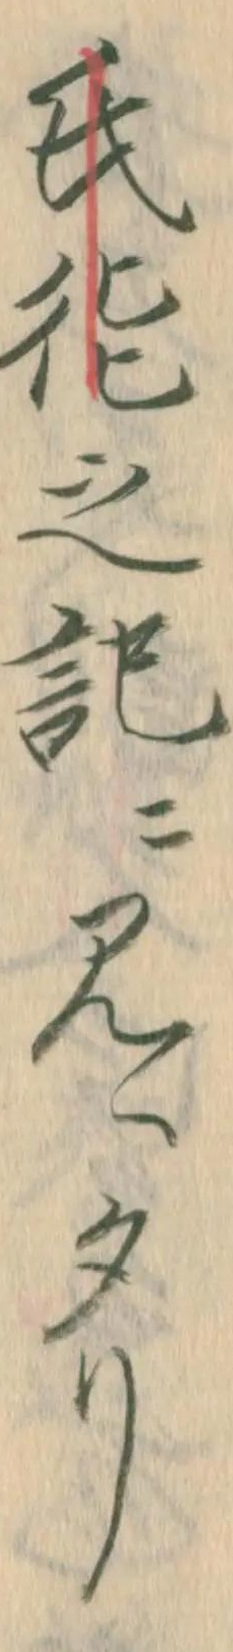氏従之記ニ見へタリ
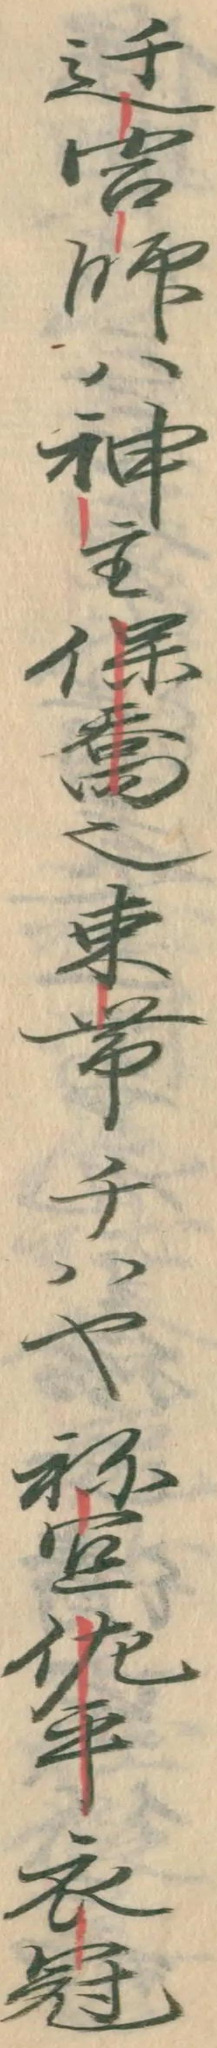迁-宮-師ハ神_主保喬也束-帯チハヤ祢-宜佐平衣-冠
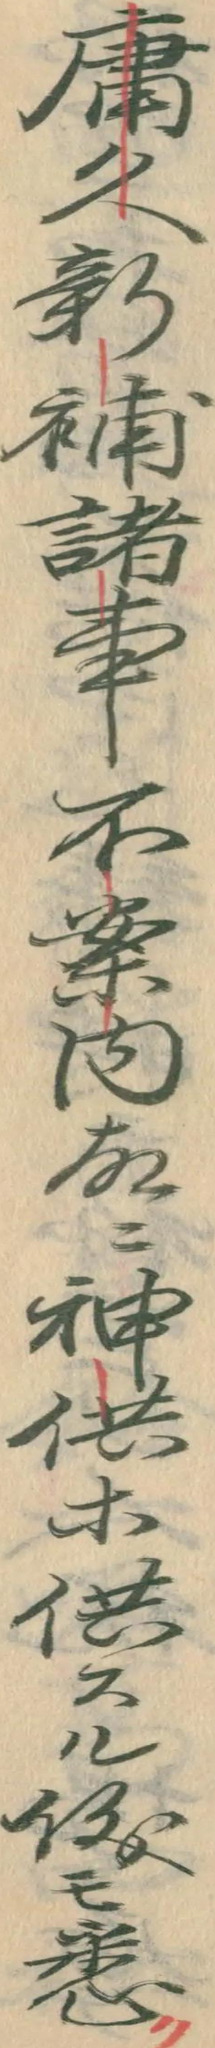庸久新-補諸-事不-案-内故ニ神-供等供スル儀モ悉

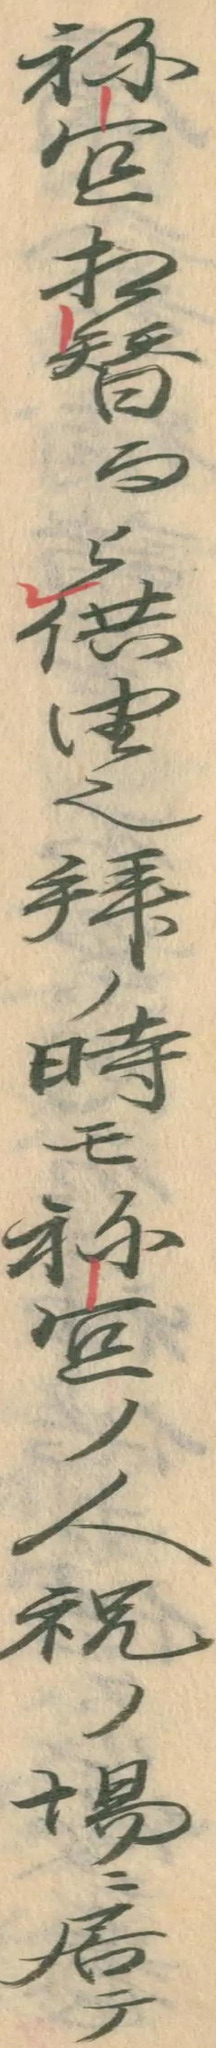祢-宜相_替而被供由也拝ノ時モ祢-宜ノ人祝ノ場ニ居テ
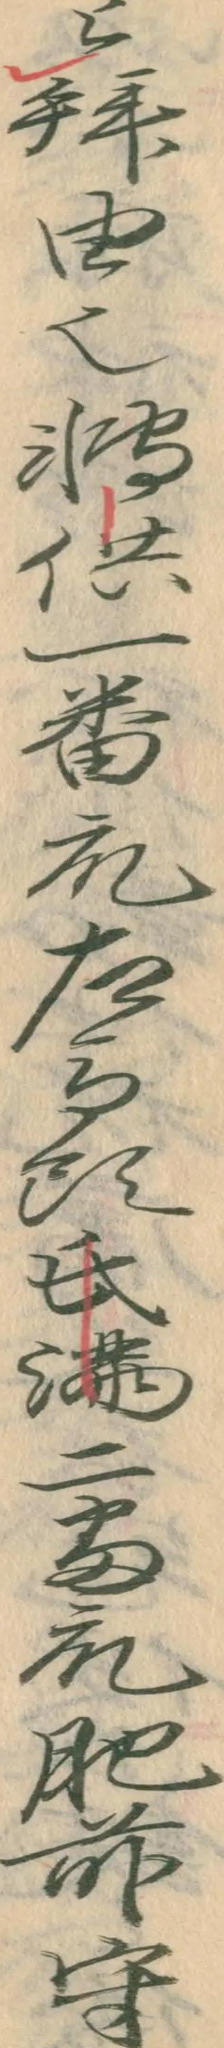被拝由也転-供一番衆左馬頭氏満二番衆肥前守
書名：賀茂社記録. 第16冊
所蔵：国立国会図書館 National Diet Library, JAPAN
